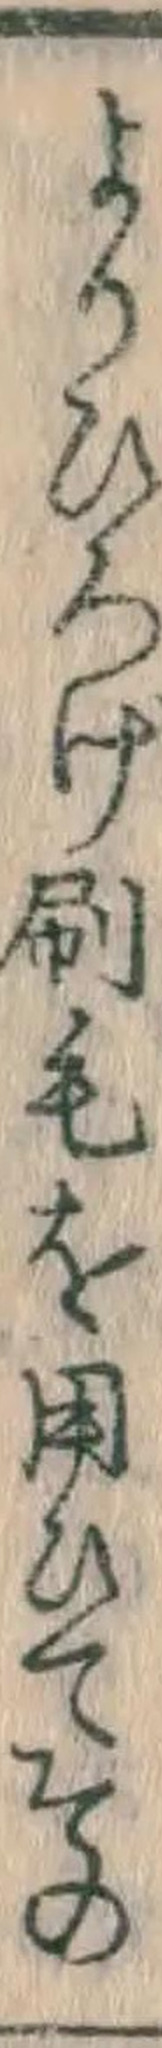よりひろげ刷毛を用ひてその
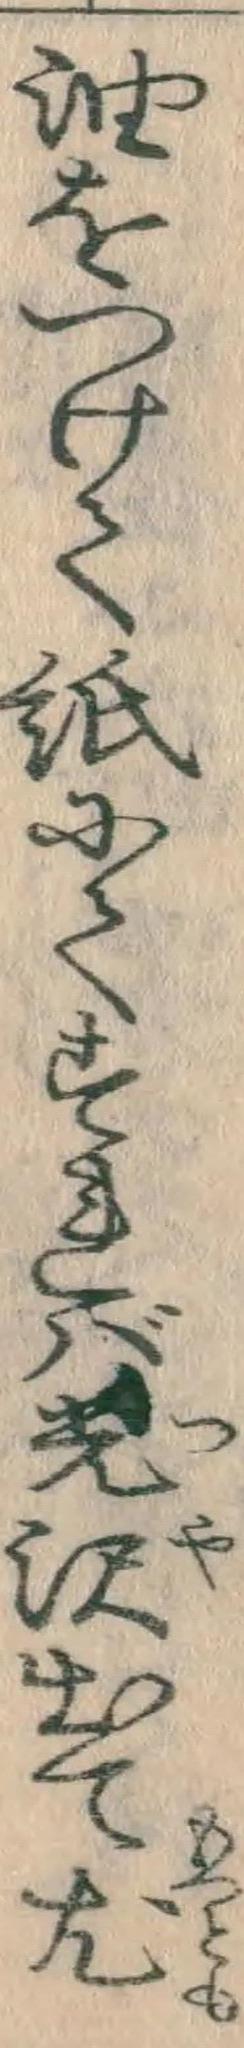油をつけて紙にてすれば光沢出て尤
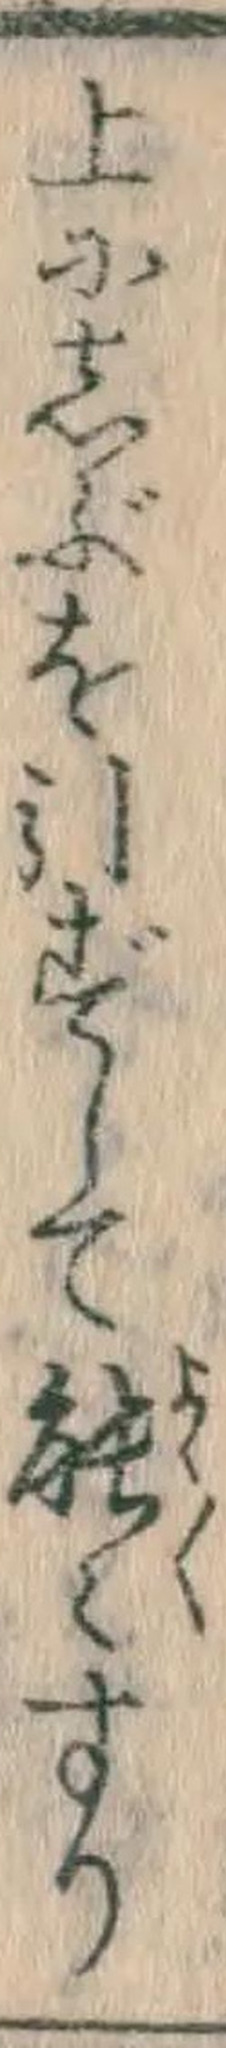上にしぶを引ずして能々すり
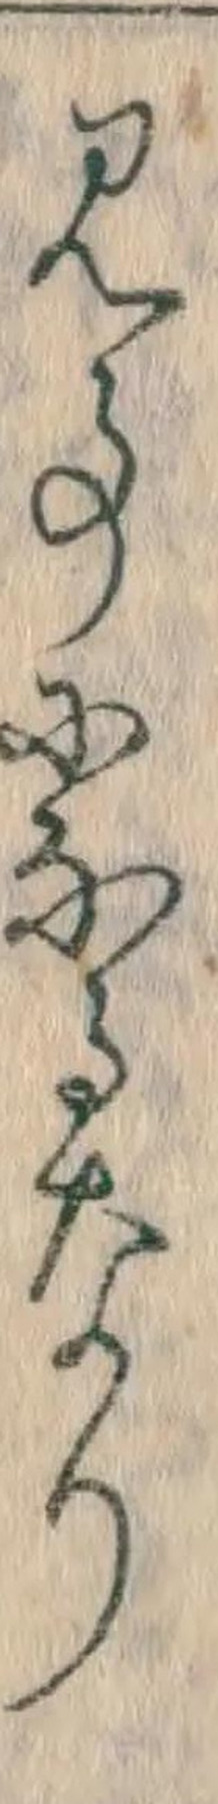見事になるなり
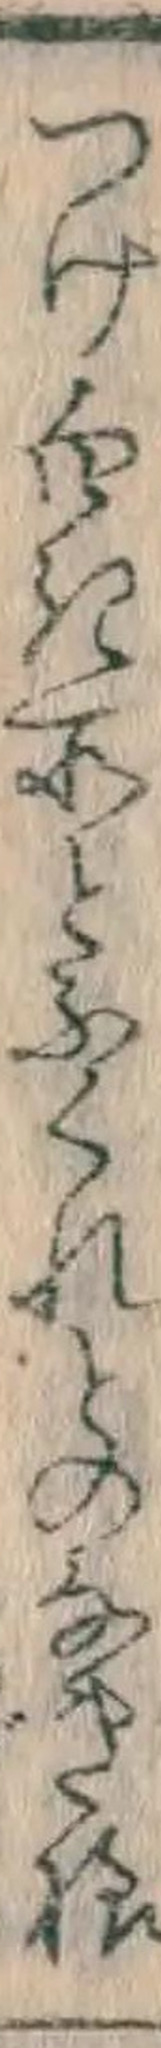つけ白き所とふくれとのなき様
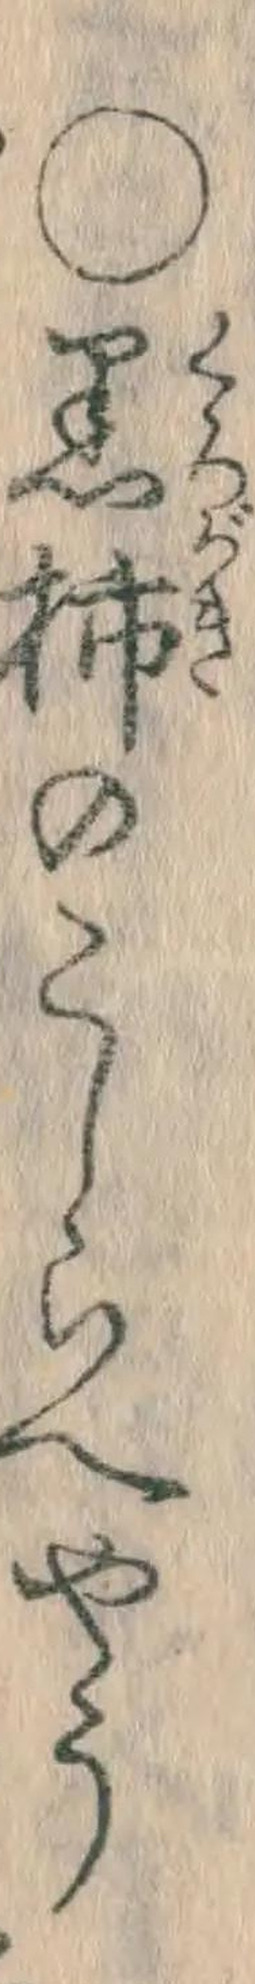○黒柿のこしらへやう
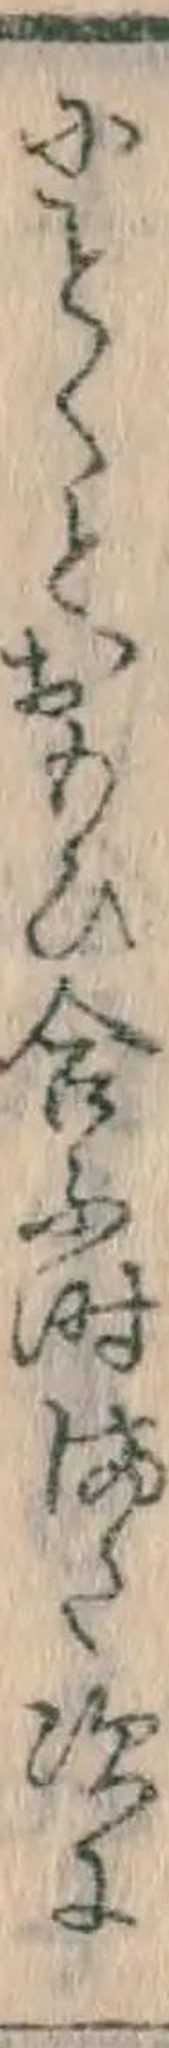にとくとおもひ合ふ時また次に
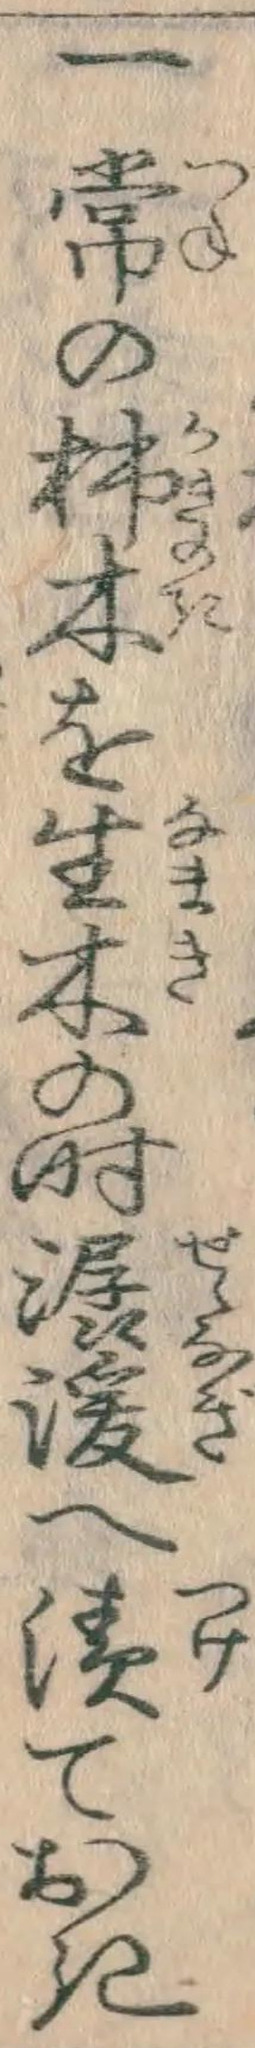一常の柿木を生木の時潺湲へ漬ておき
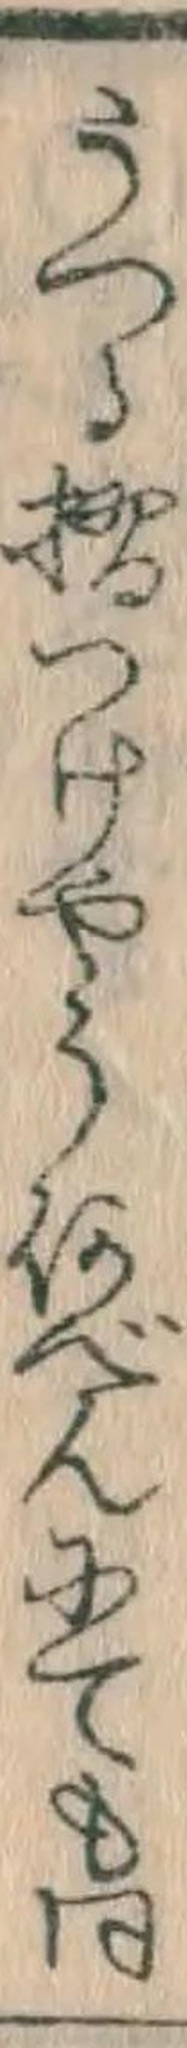うつる摺つけやう何べんにても同
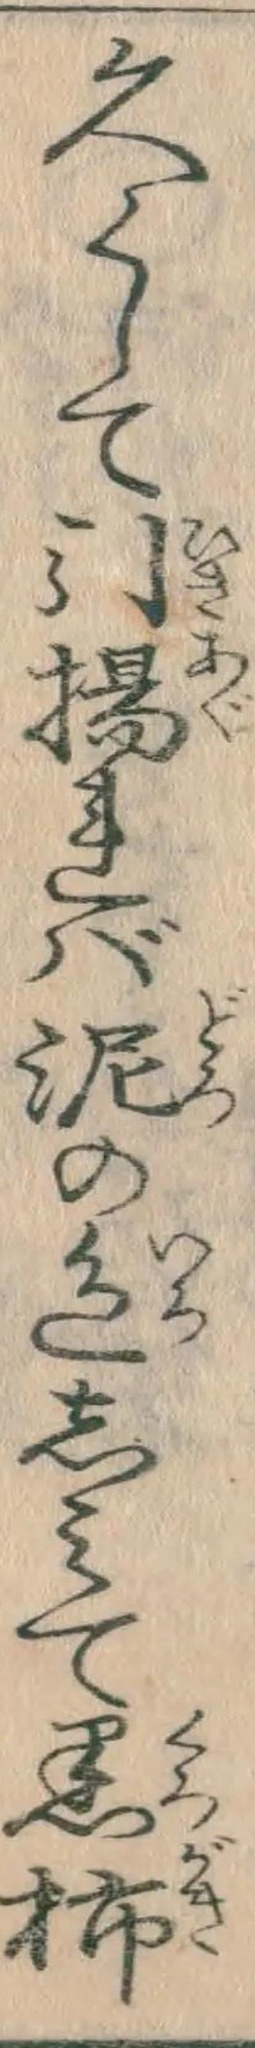久くして引揚れば泥の色しみて黒柿
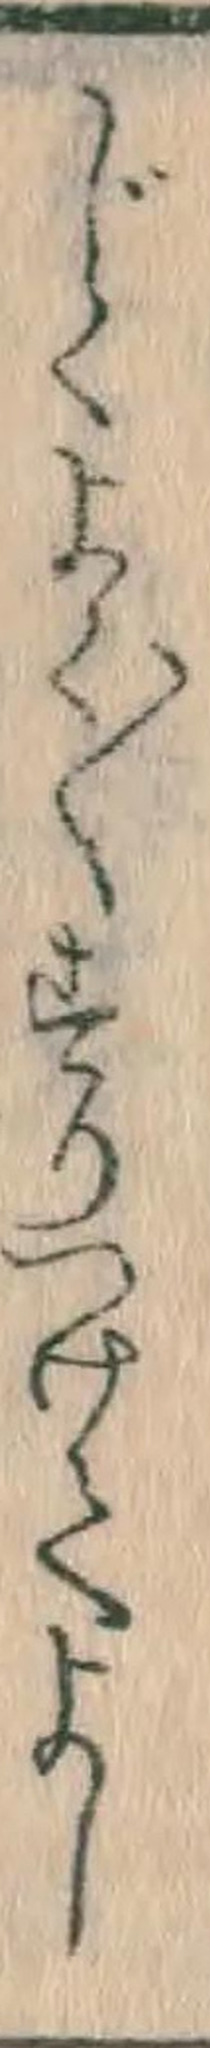じくよく〳〵すりつけてよし
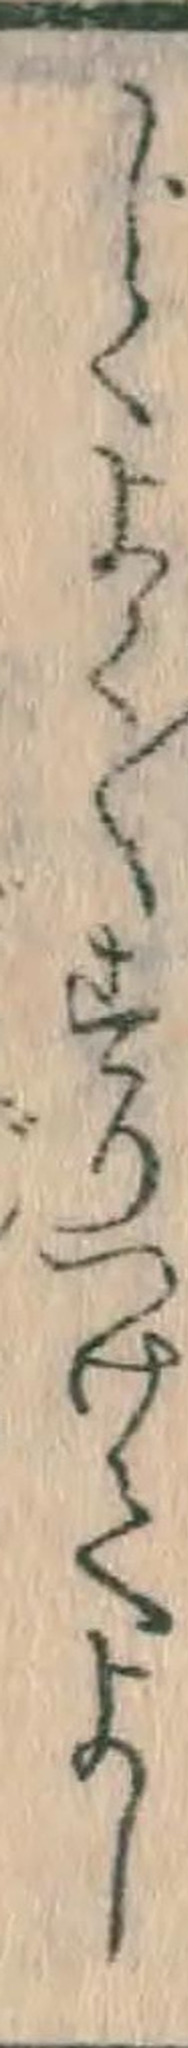じくよく〳〵すりつけてよし
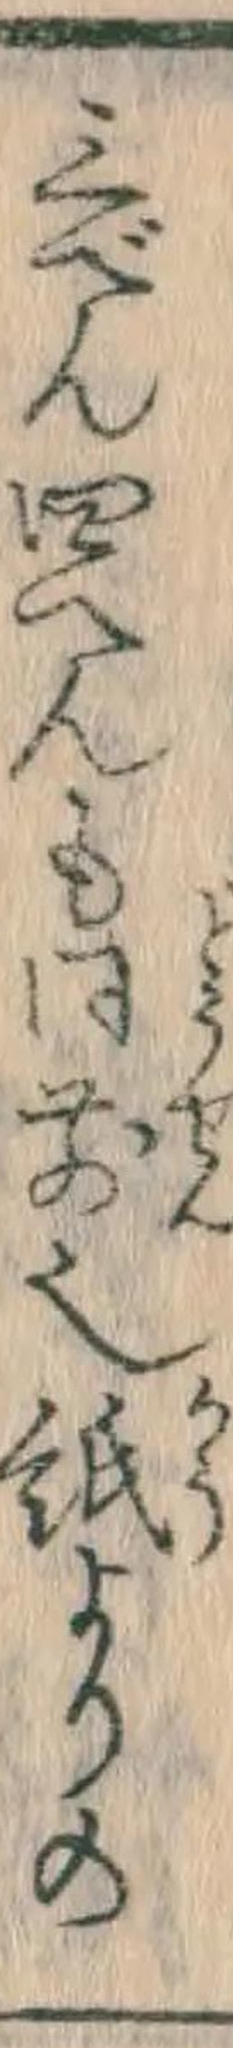三べん四へんも同前也紙よりの
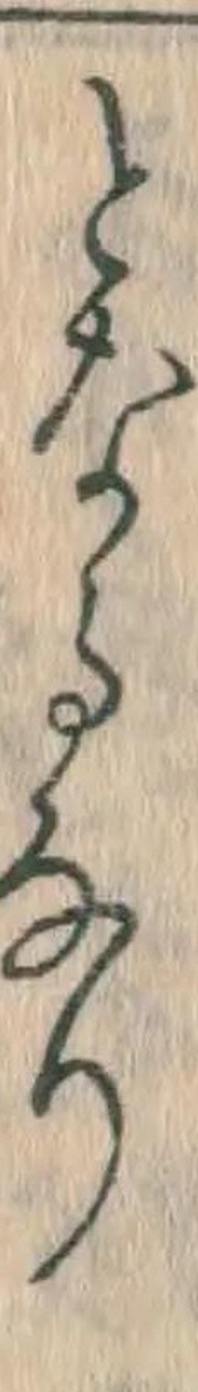となるなり
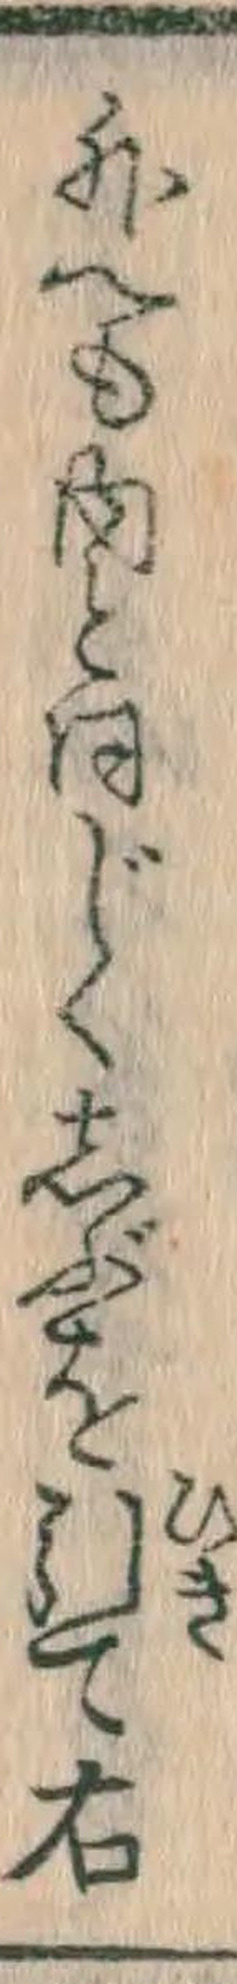外へも内と同じくしぶを引て右
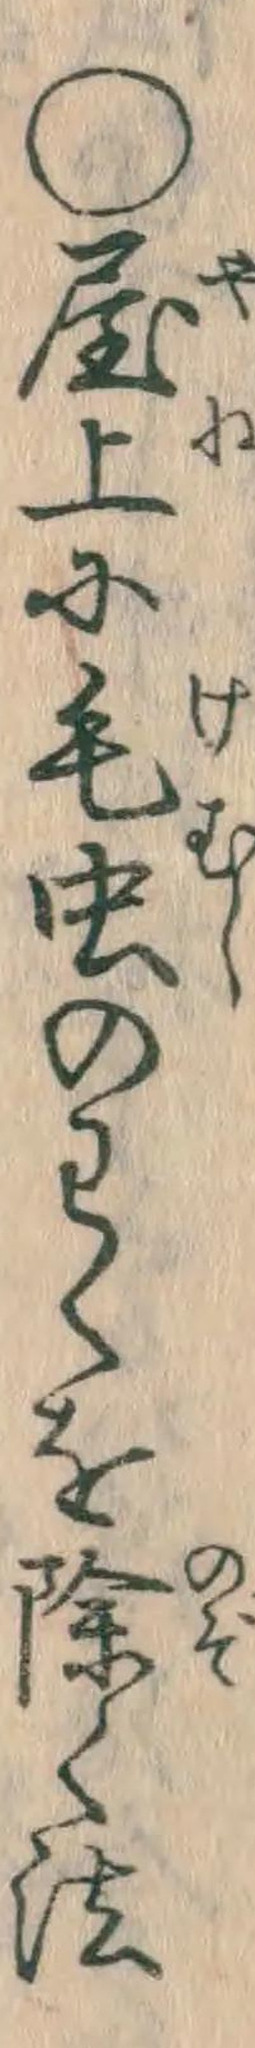○屋上に毛虫のわくを除く法
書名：広益秘事大全 3巻. [2]
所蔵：国立国会図書館 National Diet Library, JAPAN
